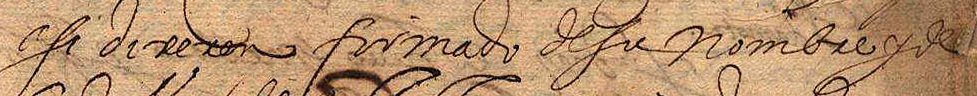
asi dixeren firmado de su nombre y de
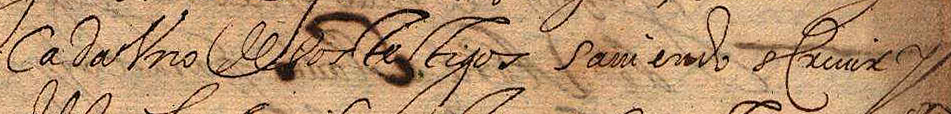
cada Vno de los testigos sauiendo sCreuir y
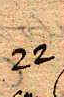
22
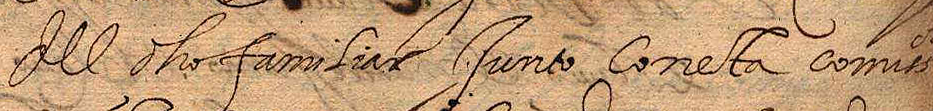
del dho familiar Junto con esta comiss.on
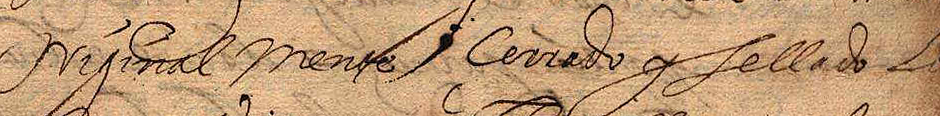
Originalmente cerrado y sellado lo
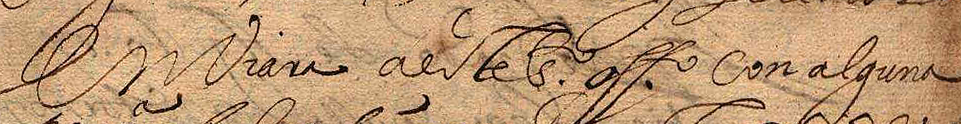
enviara a este s.to off.o con alguna
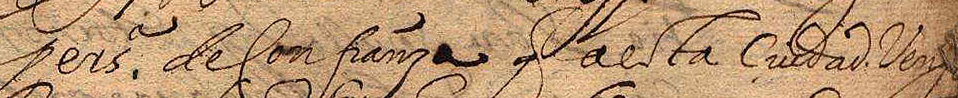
pers.a de Confianza q̄ a esta ciudad Veng
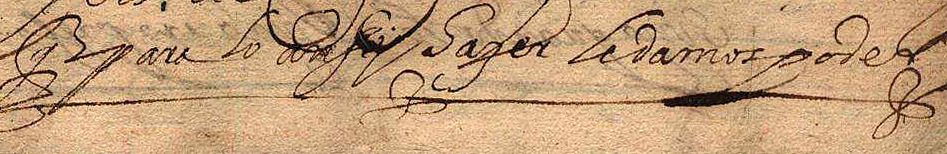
q̄ para lo ansj hazer le damos poder
